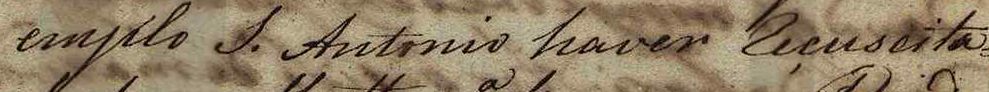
emplo S. Antonio haver Reçuscita
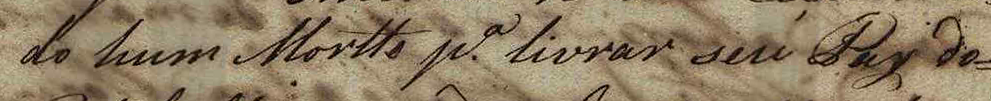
do hum Mortto p.a livrar seu Pay do
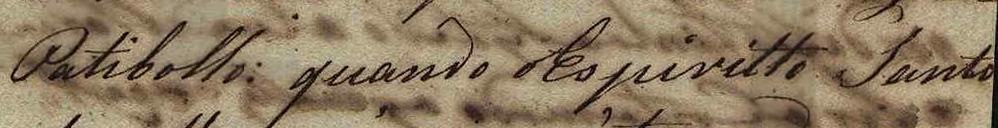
Patibollo: quando o Espiritto Santo
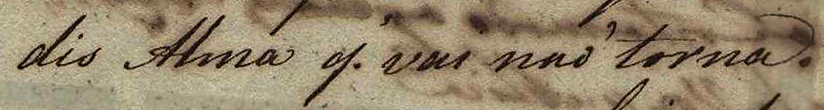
dis Alma q̄ vai naõ torna
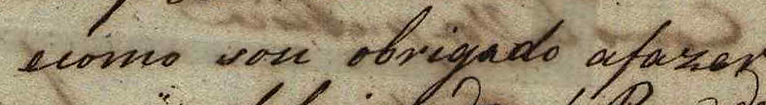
e como sou obrigado a fazer
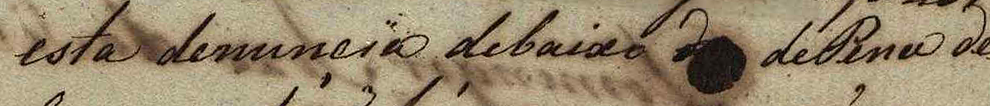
esta denuncia debaixo d_ de Pena de
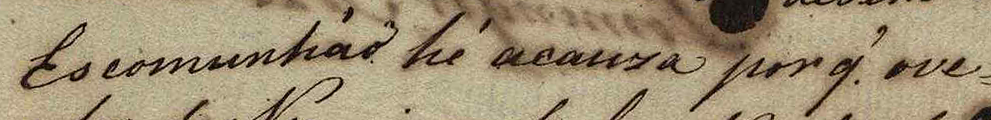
Escomunhaõ hé a cauza porq̄ o ve
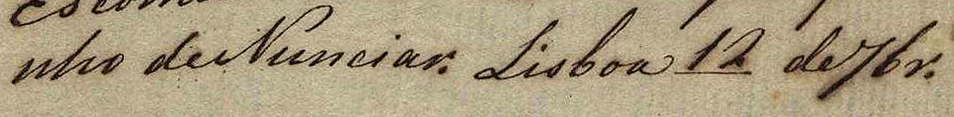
nho deNunciar Lisboa 12 de 7br.
